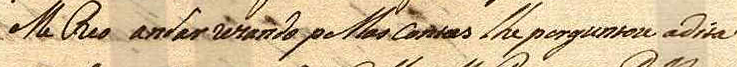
elle Reo andar rezando pellas contas lhe perguntou a dita
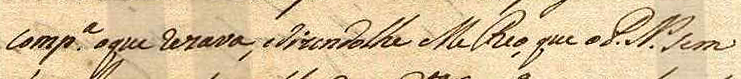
comp.a o que Rezava, e dizendolhe elle Reo, que o P. N. sem
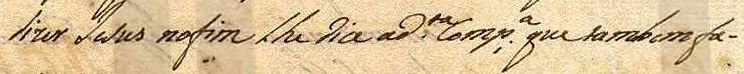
dizer Iesus no fim lhe dice a d.ta Comp;a que tambem fa
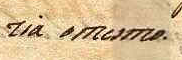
zia o mesmo.
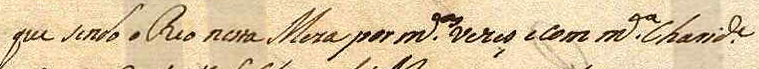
que sendo o Reo nesta Meza por m.tas vezes, e com m.ta Charid.e
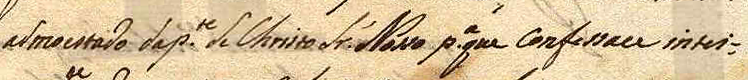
admoestado da p.te de Christo Sr̄. Nosso p.a que confessace intei
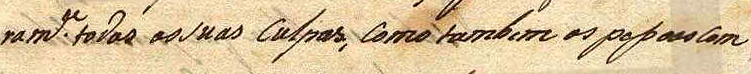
ram.te todas as suas culpas, como tambem as pessoas com
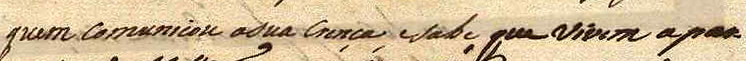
quem comunicou a sua crença e sabe que vivem apar
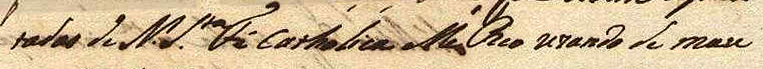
tadas de N. S.ta Fé Catholica elle Reo uzando se mau
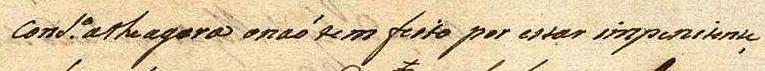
cons.o athe agora o naõ tem feito por estar impenitente
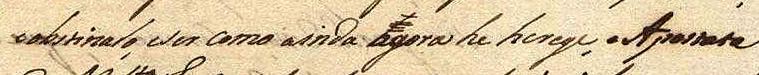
e obstinado e ser como ainda hgora he herege, e Apostata
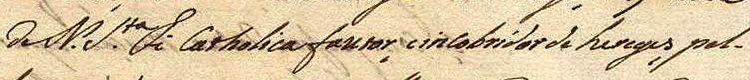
de N. S.ta Fé Catholica fautor, e incobridor de hereges, pel
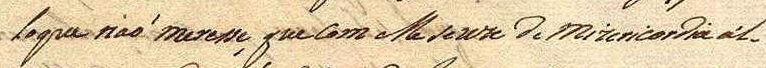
lo que naõ meresse, que com elle se uze de mizericordia ál
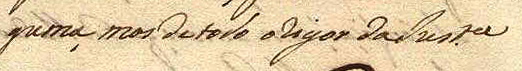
guma, mas de todo o Rigor da Iust.a
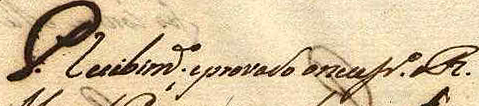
P. Recebim.to e provado o necesr.o R.
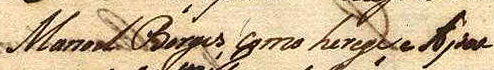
Manoel Borges, como herege, e Apos
